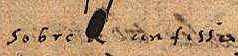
sobre a confissā
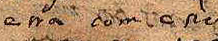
esta com o Reo
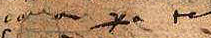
co_a ꝑa ter
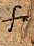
fa
